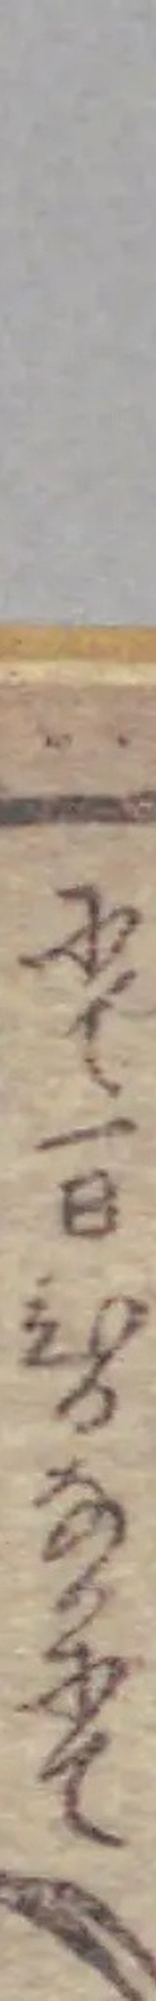にて一日ひるなかにて
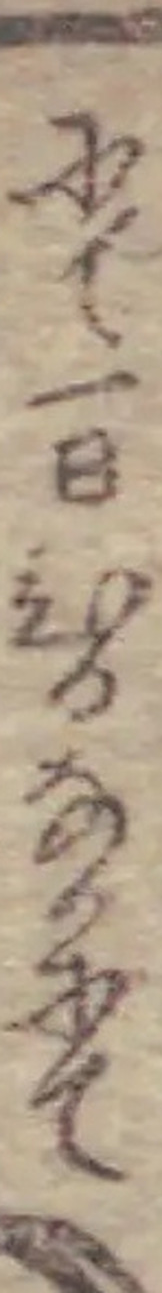にて一日ひるなかにて
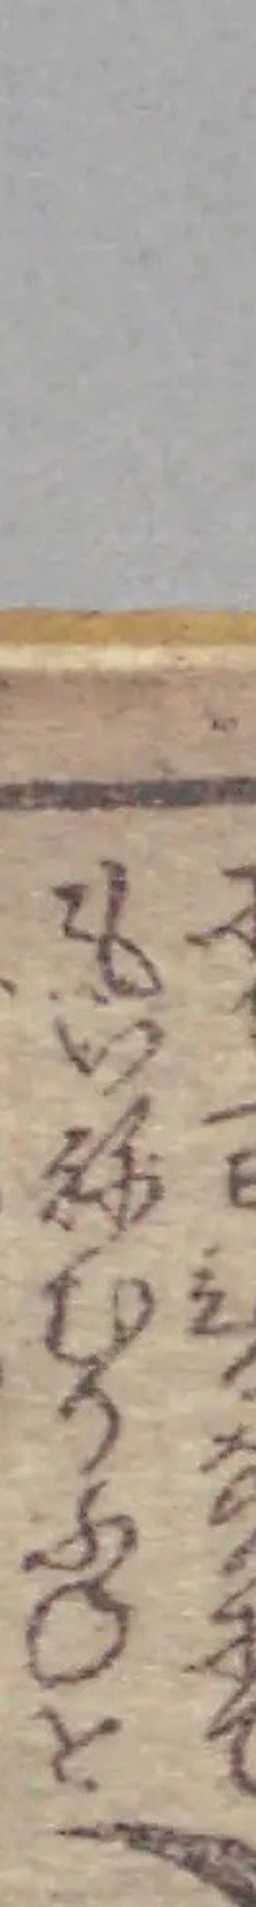もいねむりふねを
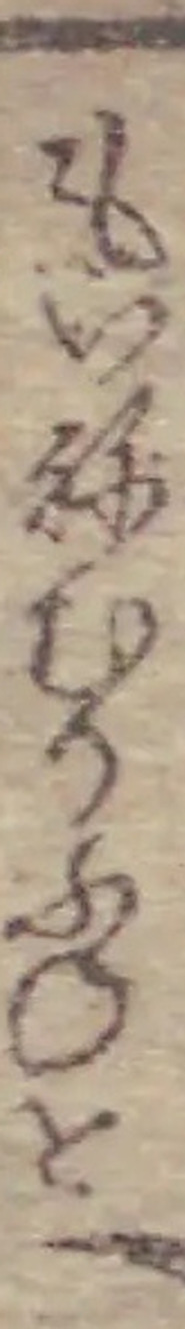もいねむりふねを
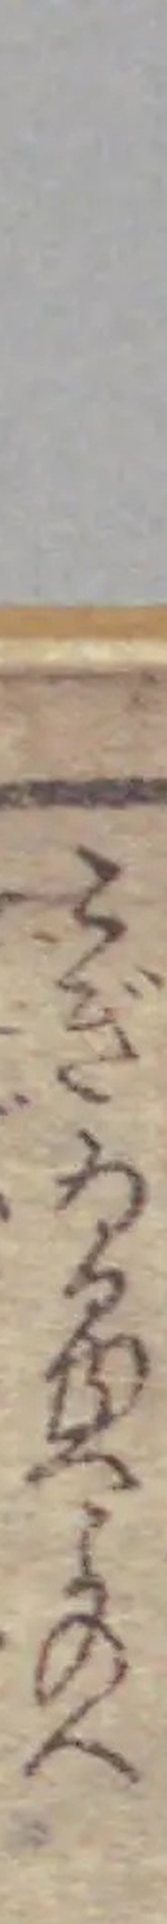こぎゐるゆへよの人
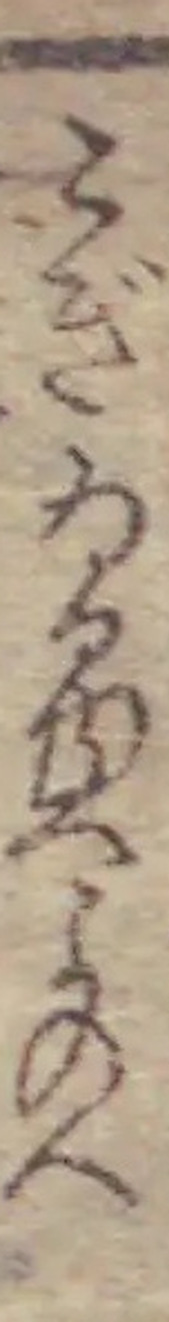こぎゐるゆへよの人
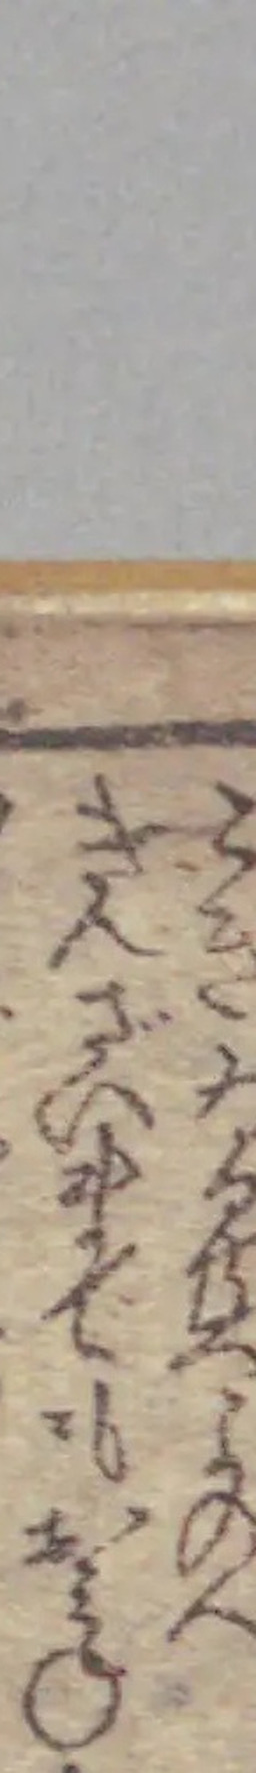きんざいまてもおみねと
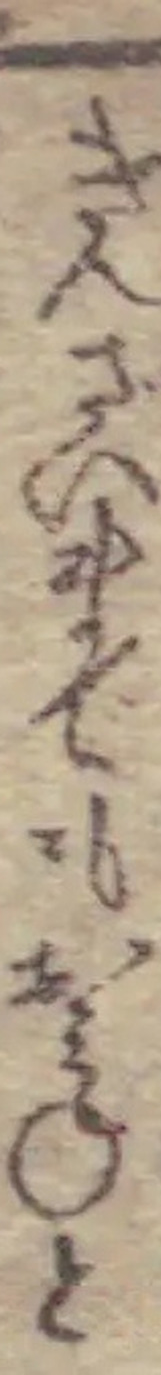きんざいまてもおみねと
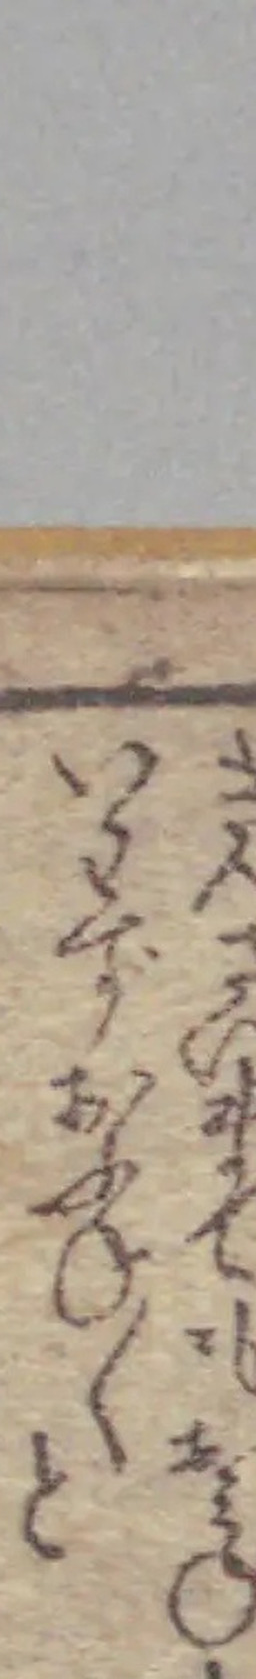いわずおふね〳〵と
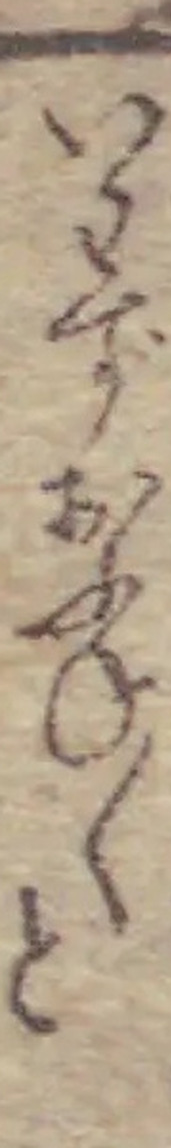いわずおふね〳〵と
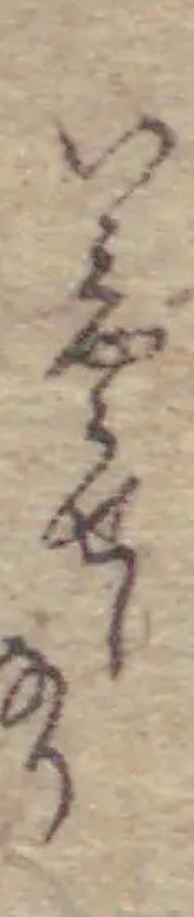いみやうせしなり

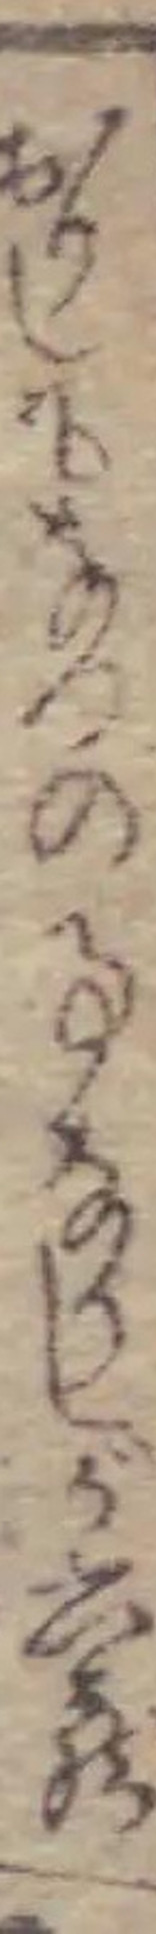おりしもなつの事なりしが六蔵
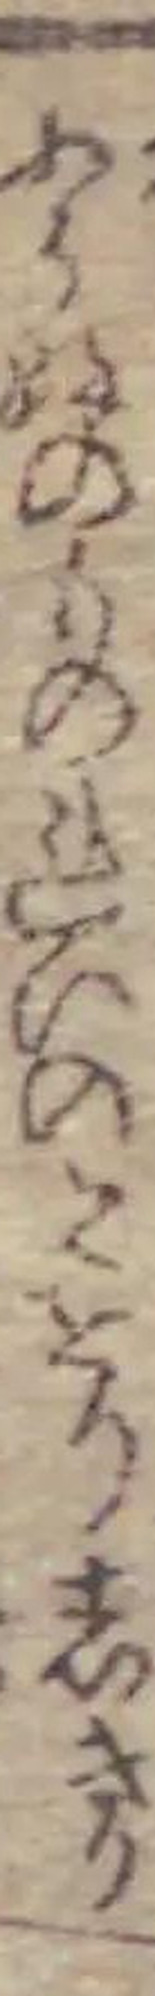ふうふのものれいのとをりしきり
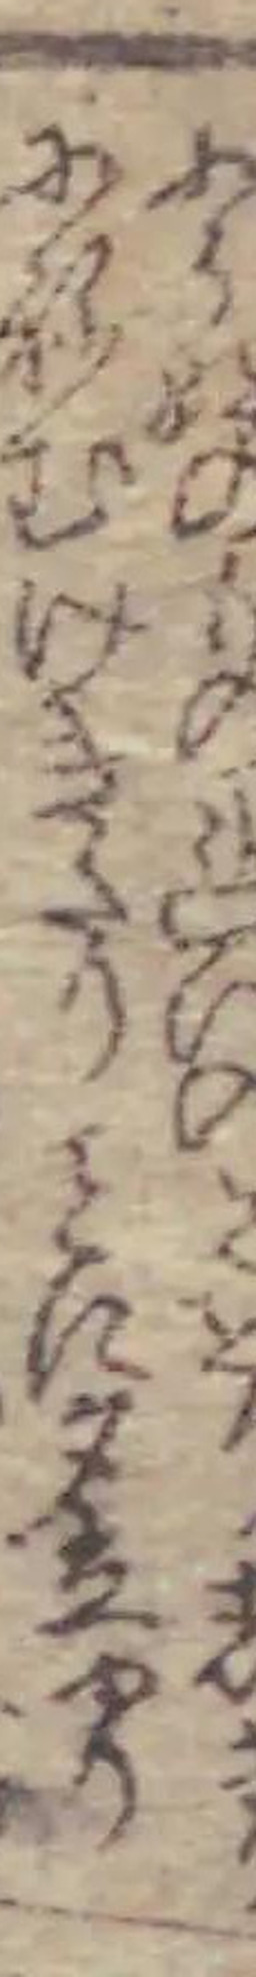にねむけきたりことに夕立ふり
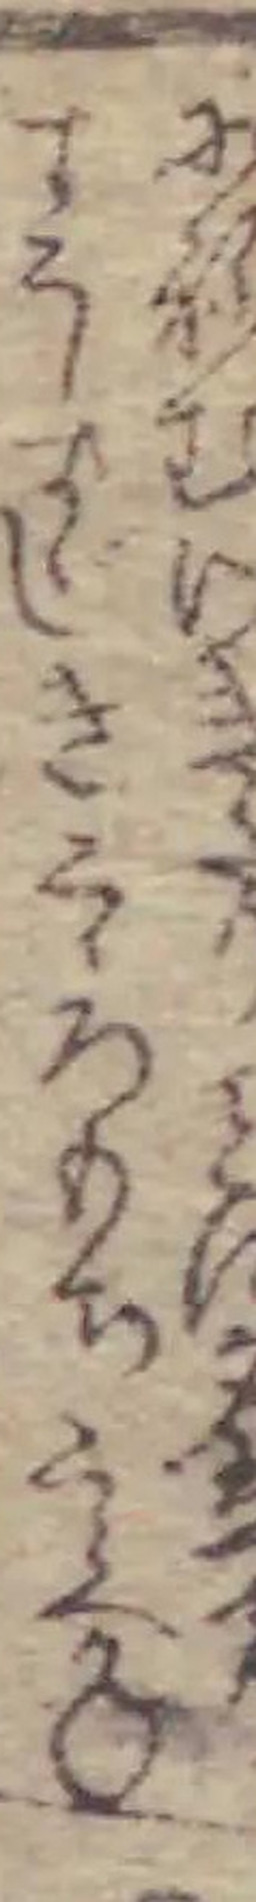すこしすゞしきこゝろもちこらへかね
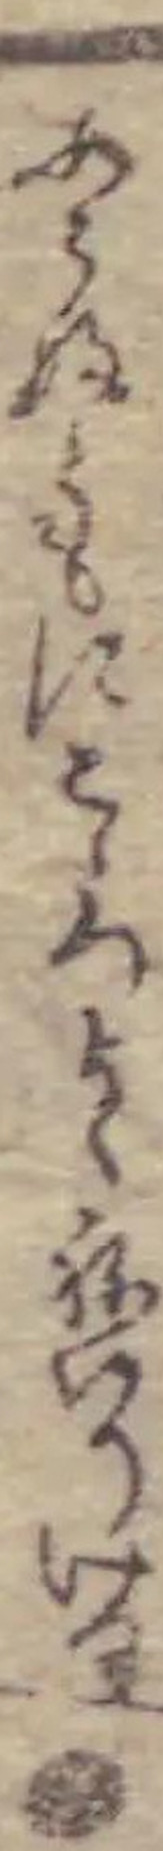ふうふともにこゝろよくねいりける
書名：飛た間違矢口噂 2巻
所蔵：国立国会図書館 National Diet Library, JAPAN
